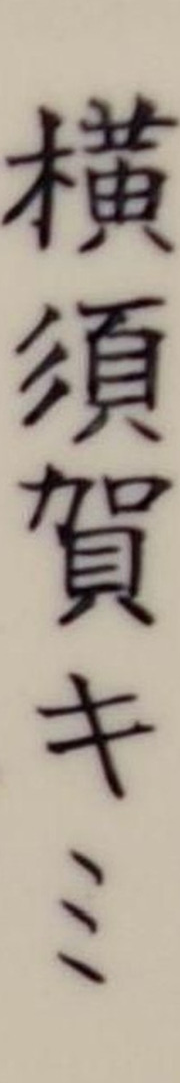横須賀キミ
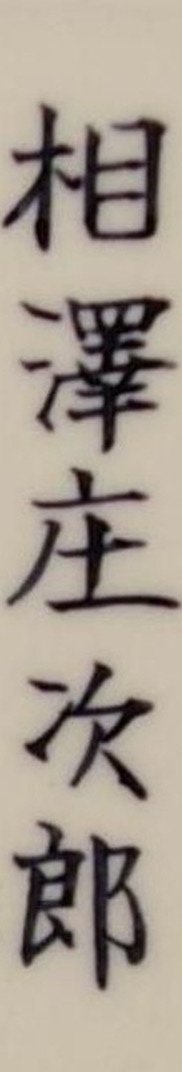相澤庄次郎
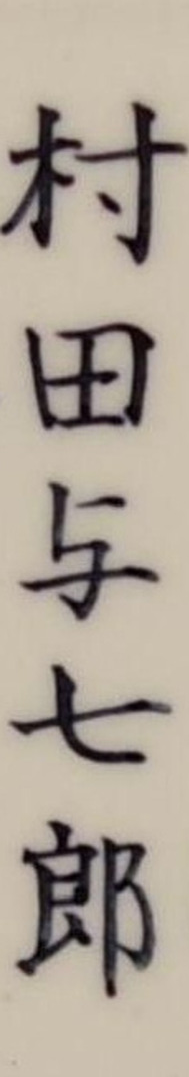村田与七郎
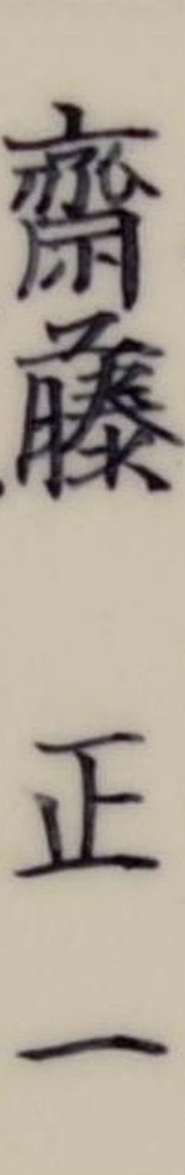斎藤正一
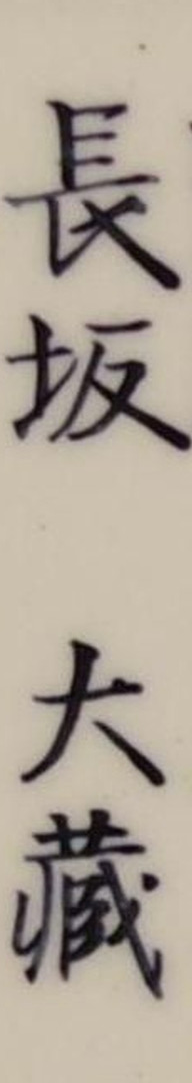長坂大蔵
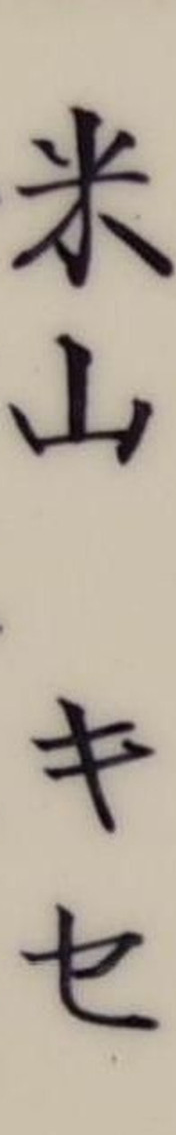米山キセ
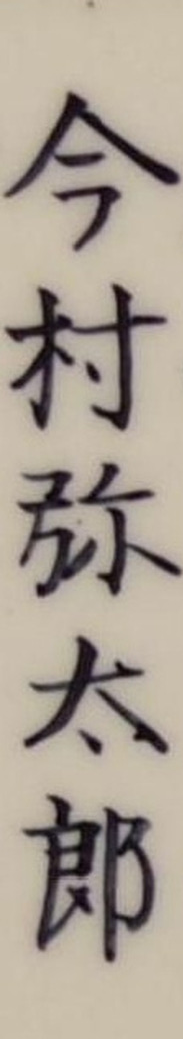今村弥太郎
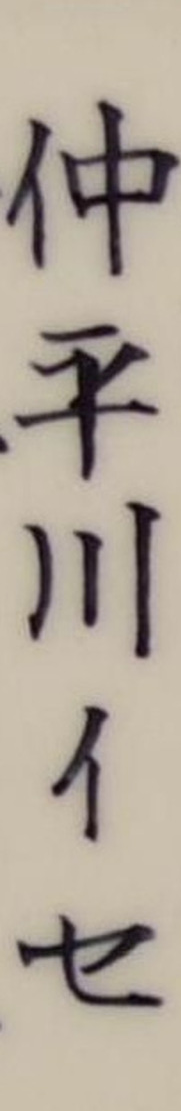仲平川イセ
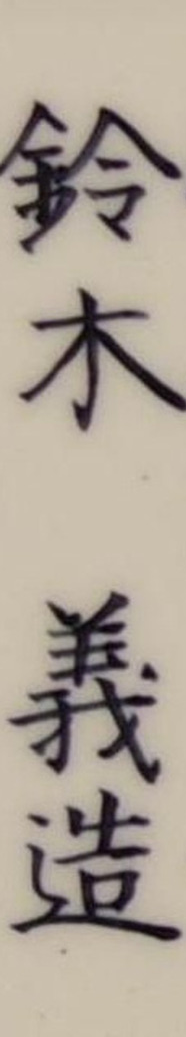鈴木義造
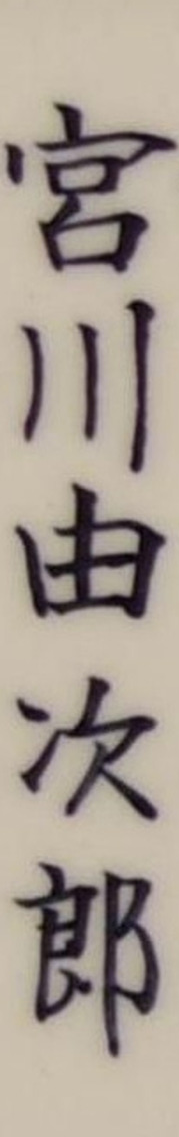宮川由次郎
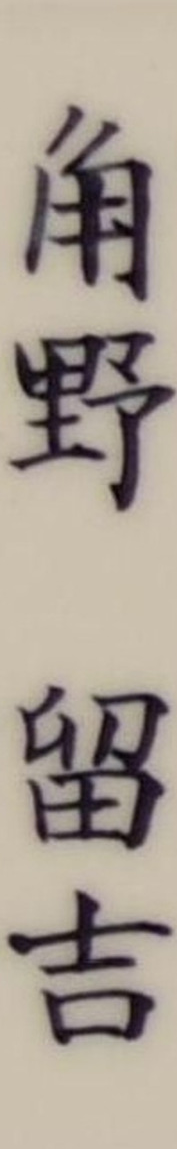角野留吉
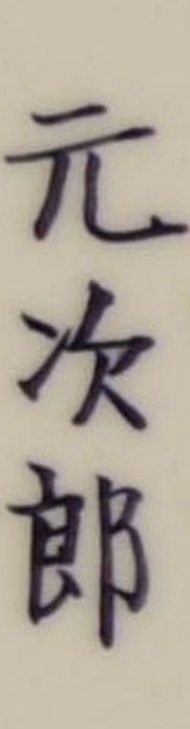元次郎
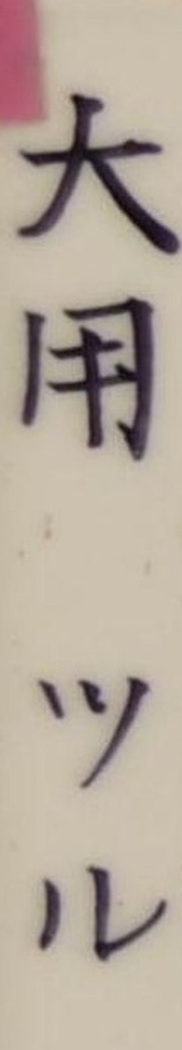大用ツル

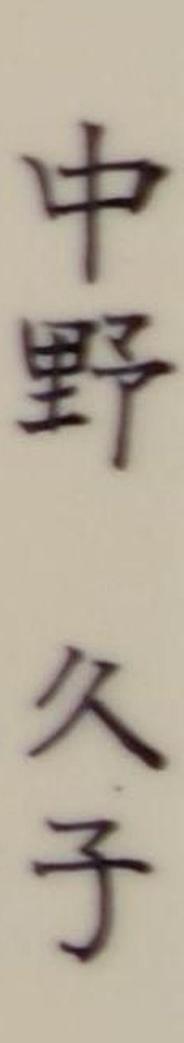中野久子
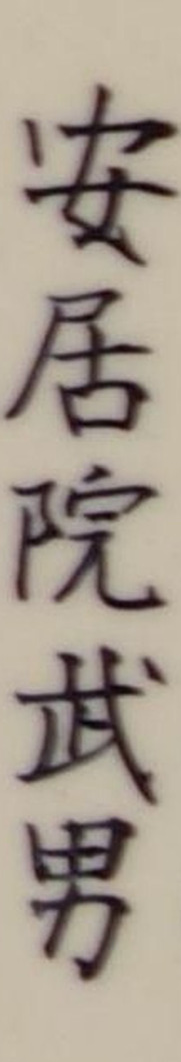安居院武男
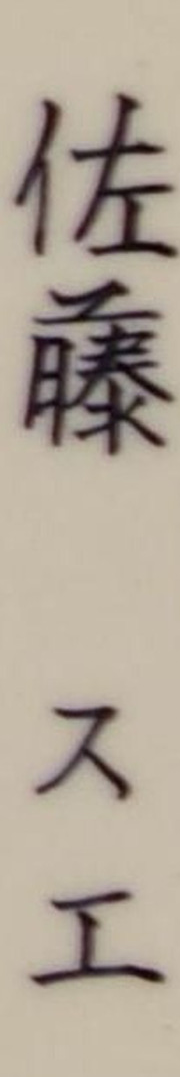佐藤スエ
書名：M~S
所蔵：高野山金剛峯寺
